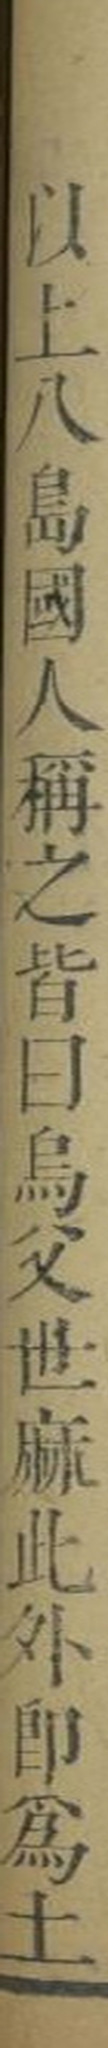以上八島国人称之皆曰烏父世麻此外即為土
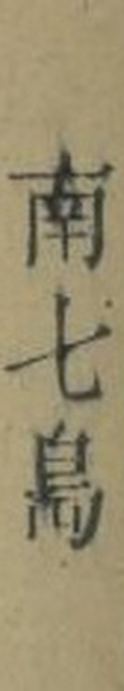南七島
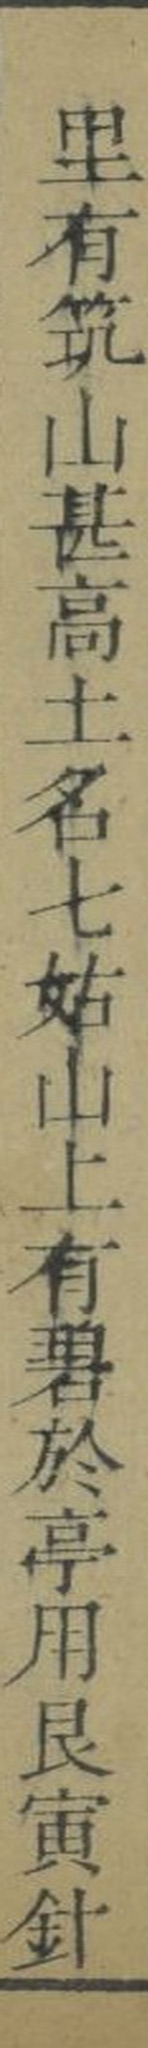里有筑山甚高土名七姑山上有碧於亭用艮寅針
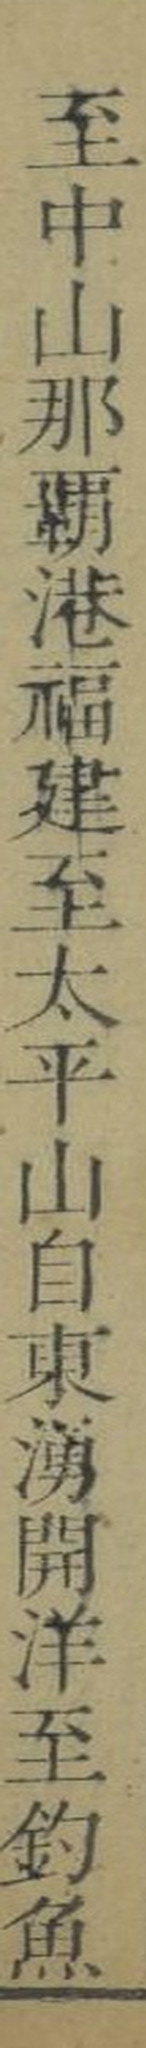至中山那覇港福建至太平山自東湧開洋至釣魚
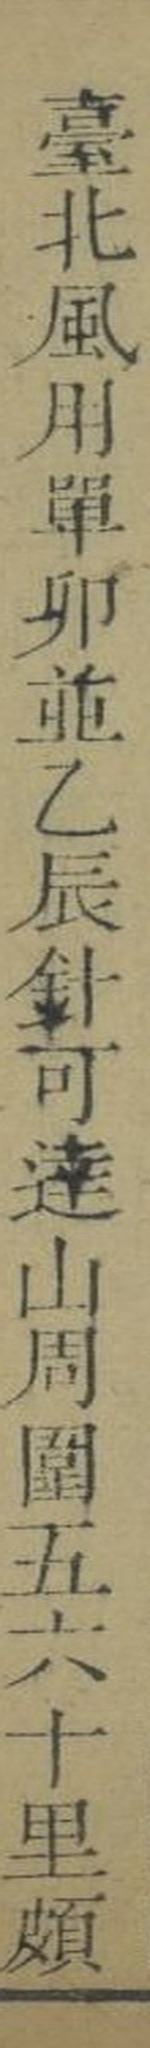台北風用単卯並乙辰針可達山周囲五六十里頗
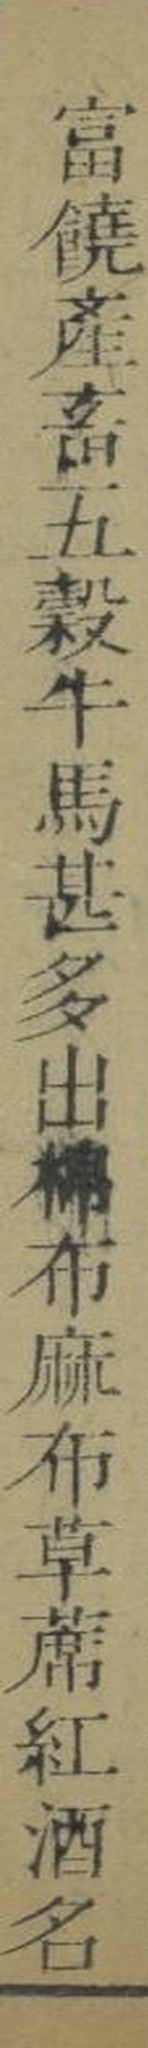富饒産畜五穀牛馬甚多出棉布麻布草蓆紅酒名
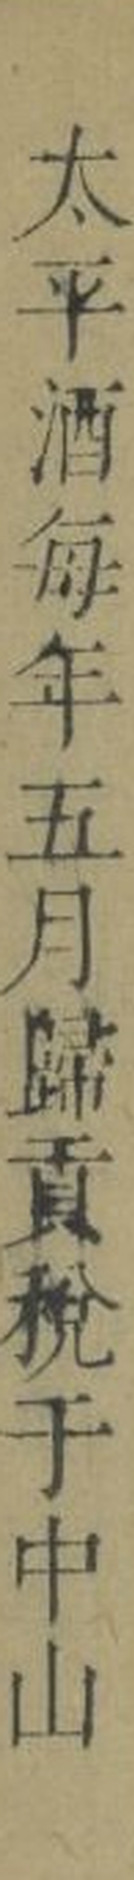太平酒毎年五月帰貢税于中山
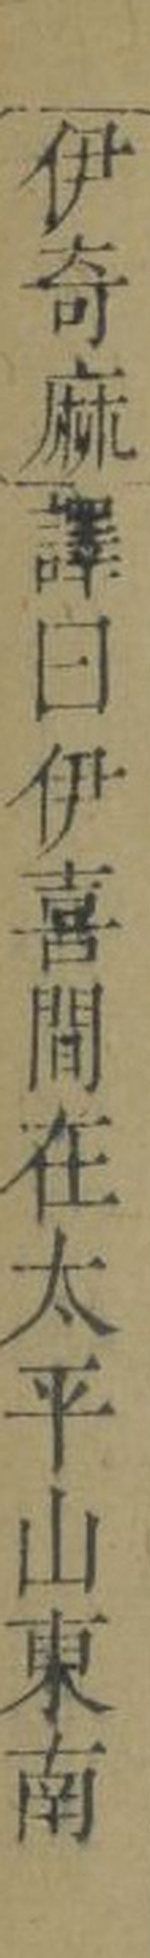[伊奇麻]訳曰伊喜間在太平山東南

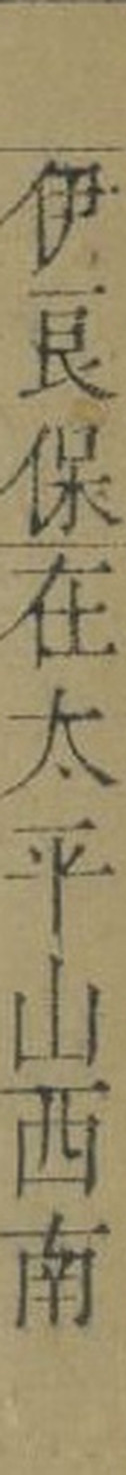[伊良保]在太平山西南
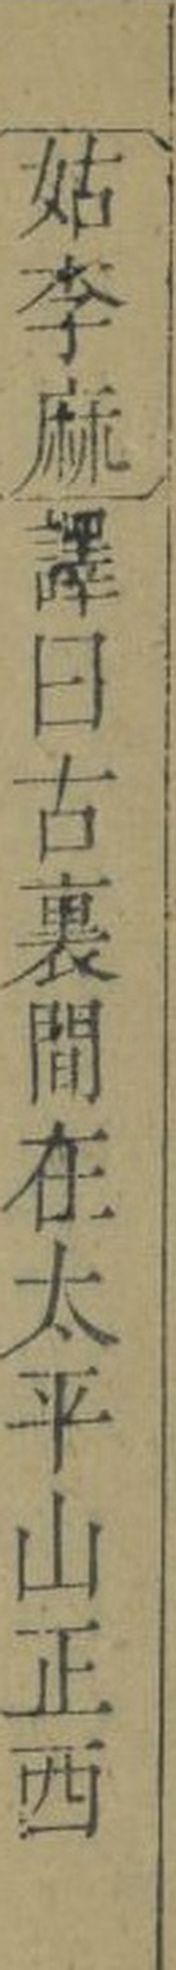[姑李麻]訳曰古裏間在太平山正西
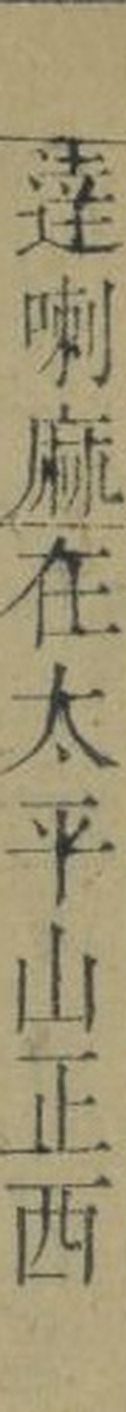[達喇麻]在太平山正西
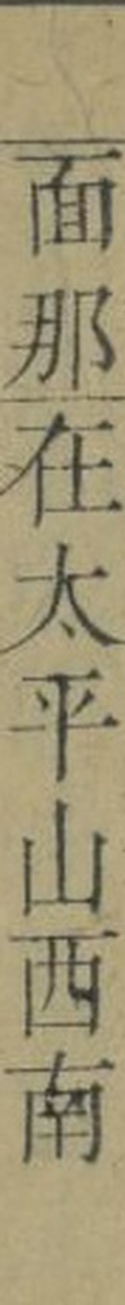[面那]在太平山西南
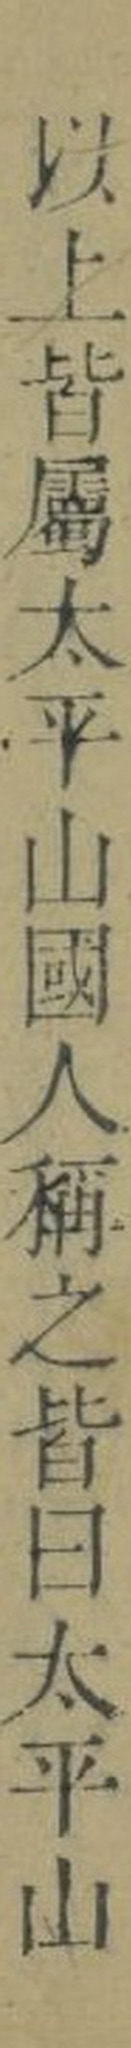以上皆属太平山国人称之皆曰太平山
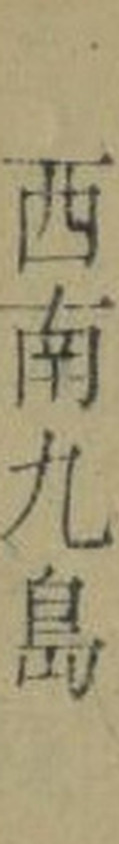西南九島
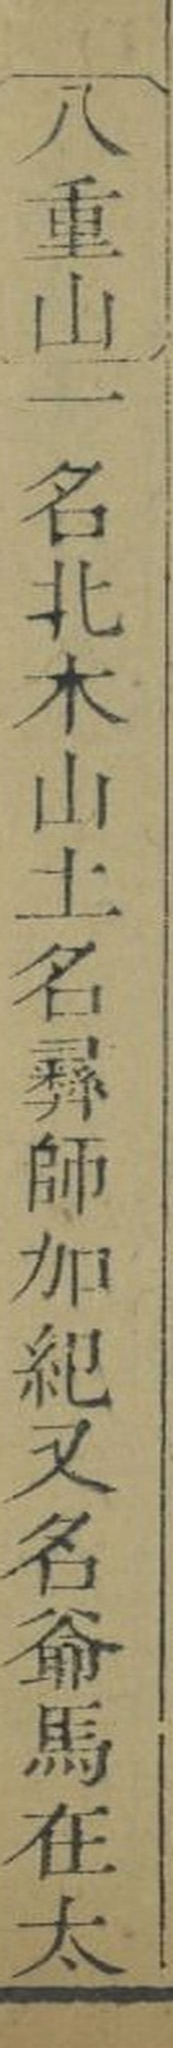[八重山]一名北木山土名彝師加紀又名爺馬在太
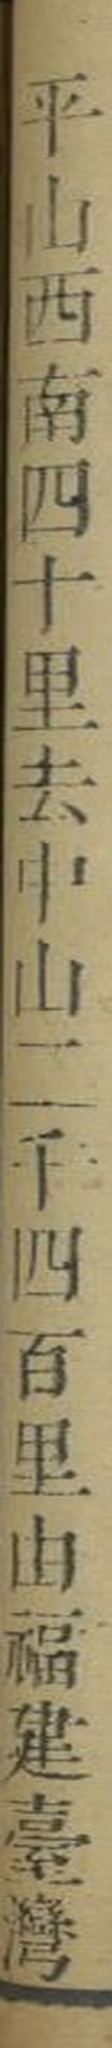平山西南四十里去中山二千四百里由福建台湾
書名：中山伝信録 巻四
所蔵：University of the Ryukyus Library
